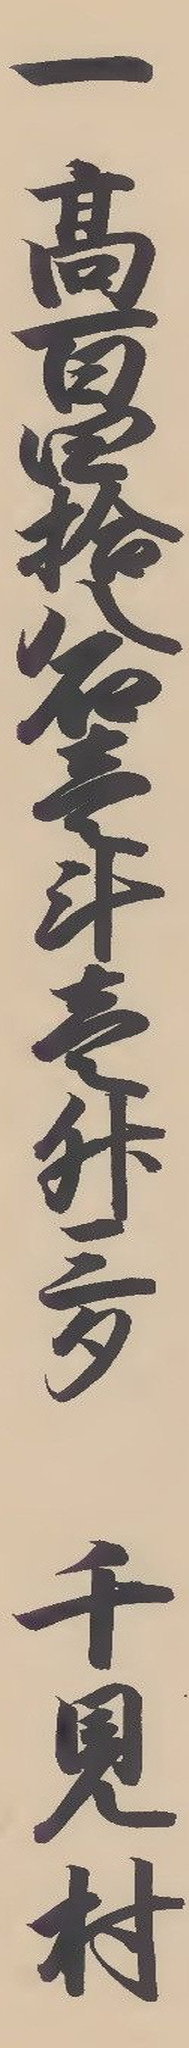一高百四拾八石壱斗壱升三勺千見村

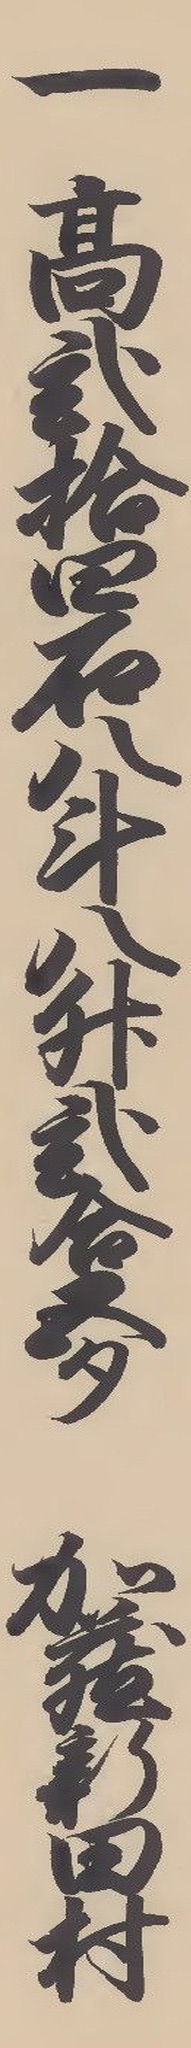一高弐拾四石八斗八升弐合五勺加蔵新田村
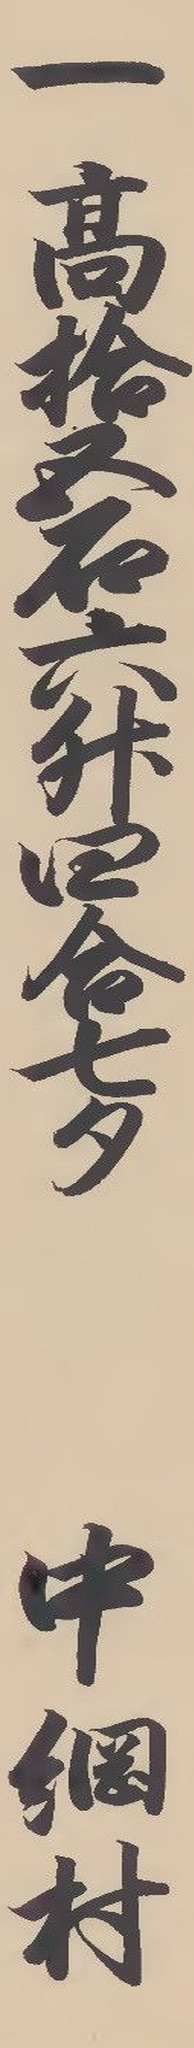一高拾五石六升四合七勺中綱村
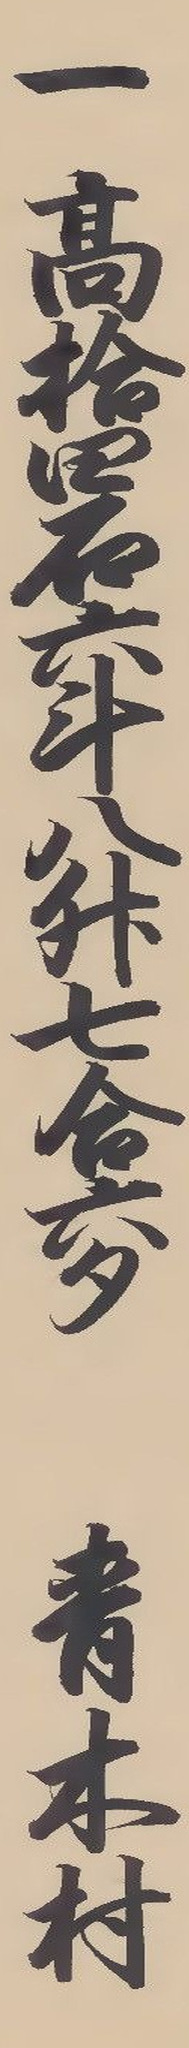一高拾四石六斗八升七合六勺青木村
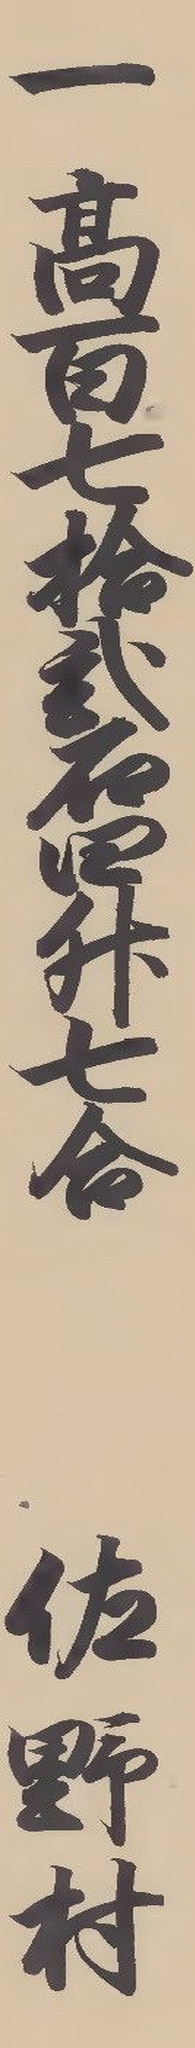一高百七拾弐石四升七合佐野村
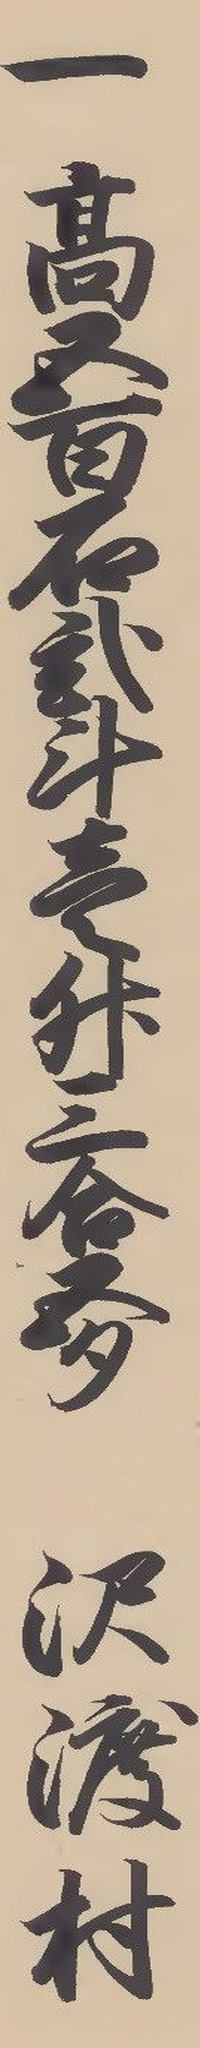一高五百石弐斗壱升三合五勺沢渡村

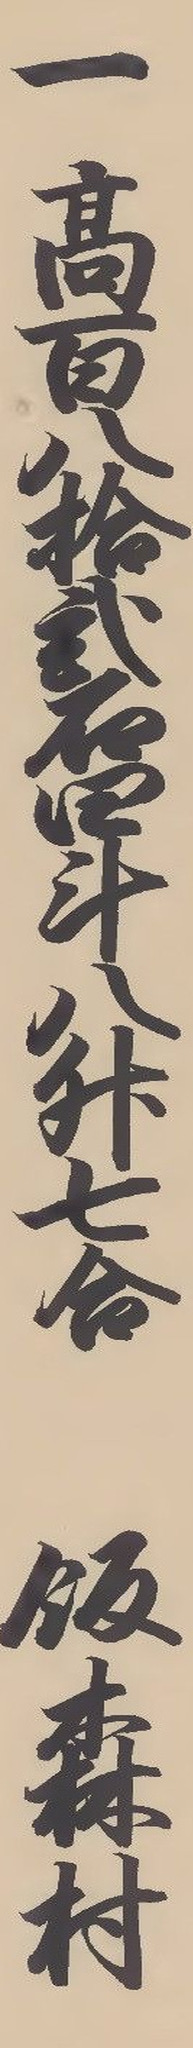一高百八拾弐石四斗八升七合飯森村
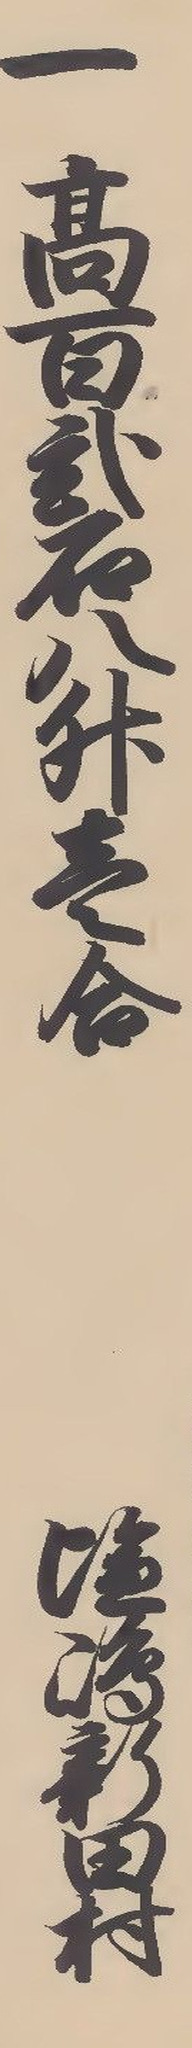一高百弐石八升壱合塩島新田村
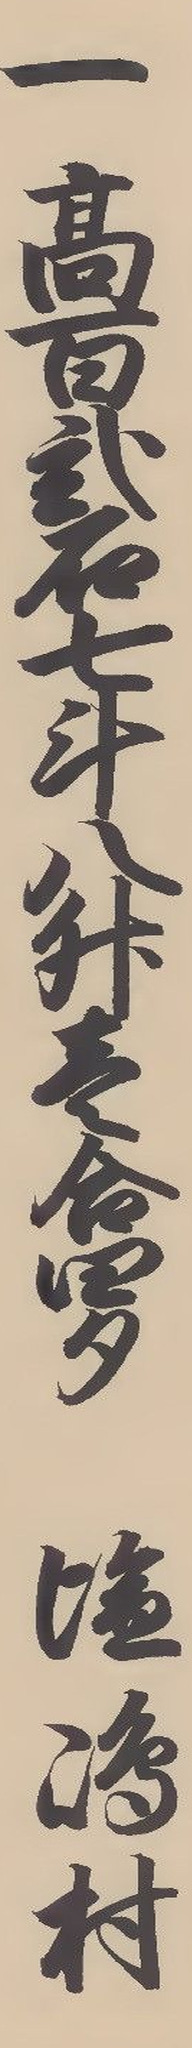一高百弐石七斗八升壱合四勺塩島村

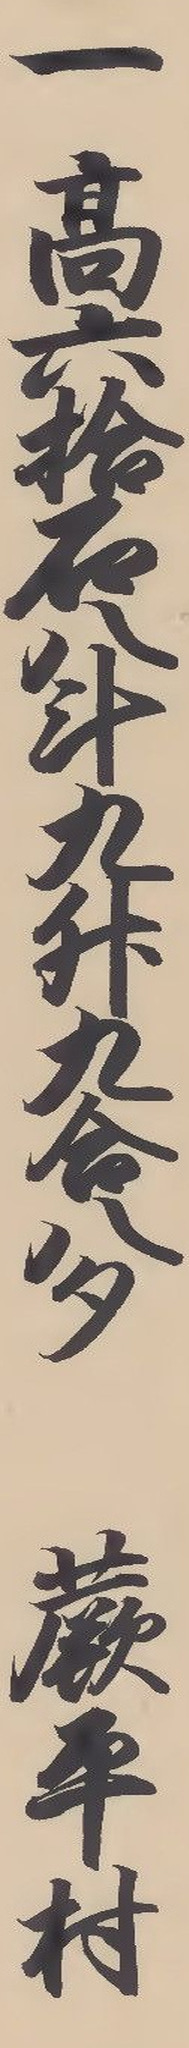一高六拾石八斗九升九合八勺蕨平村
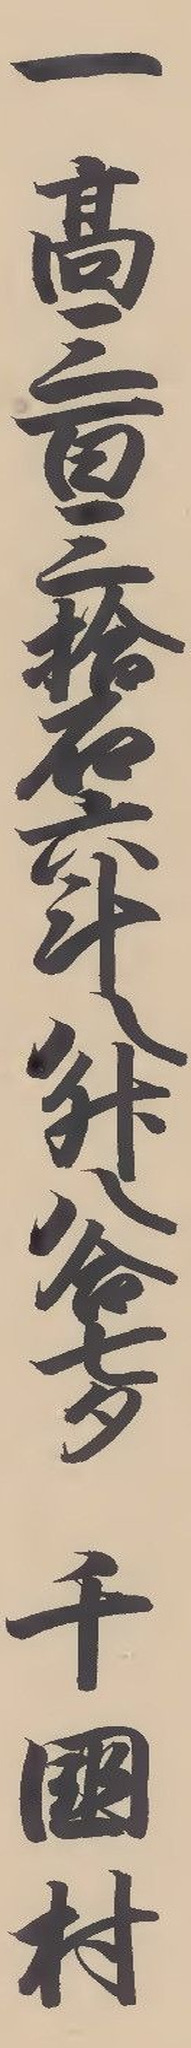一高三百三拾石六斗八升八合七勺千国村
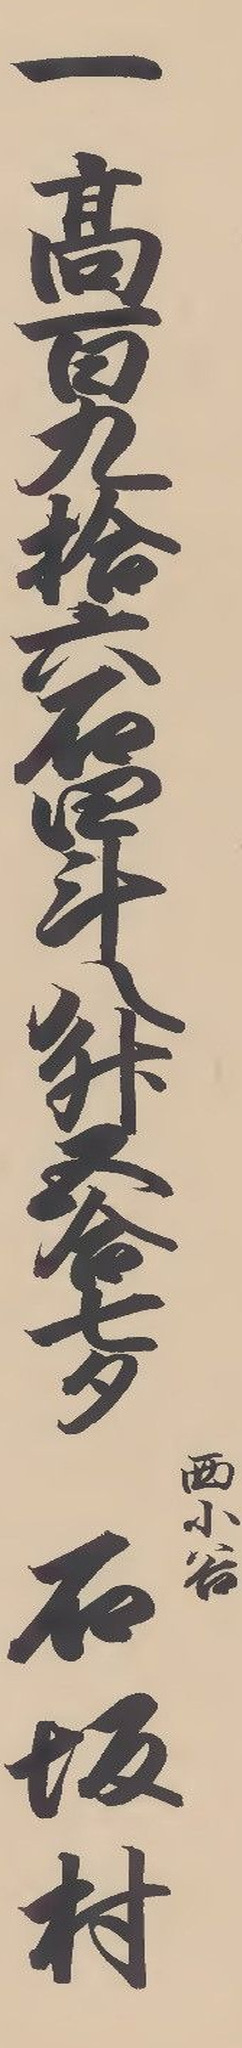一高百九拾六石四斗八升五合七勺石坂村
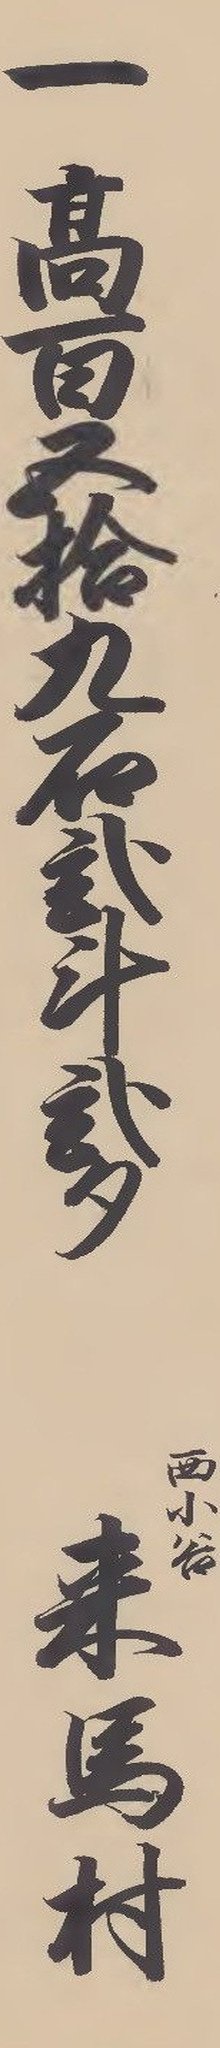一高百五拾九石弐斗弐勺来馬村
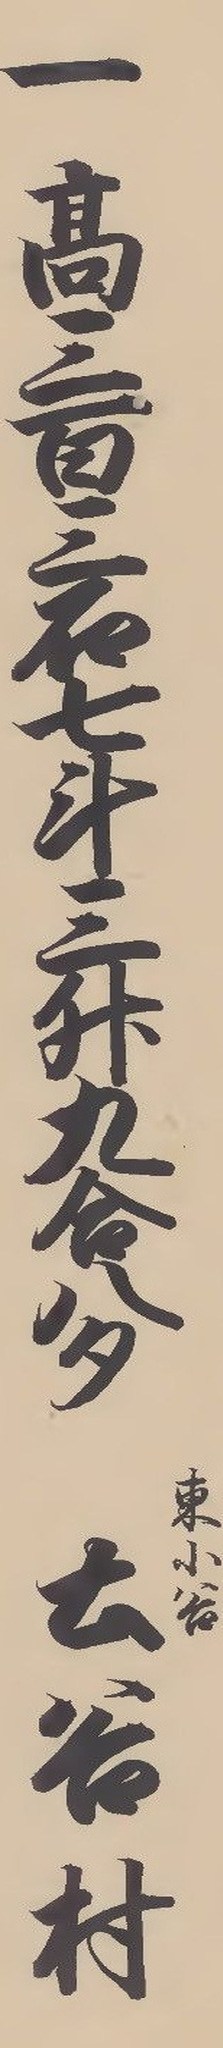一高三百三石七斗三升九合八勺土谷村
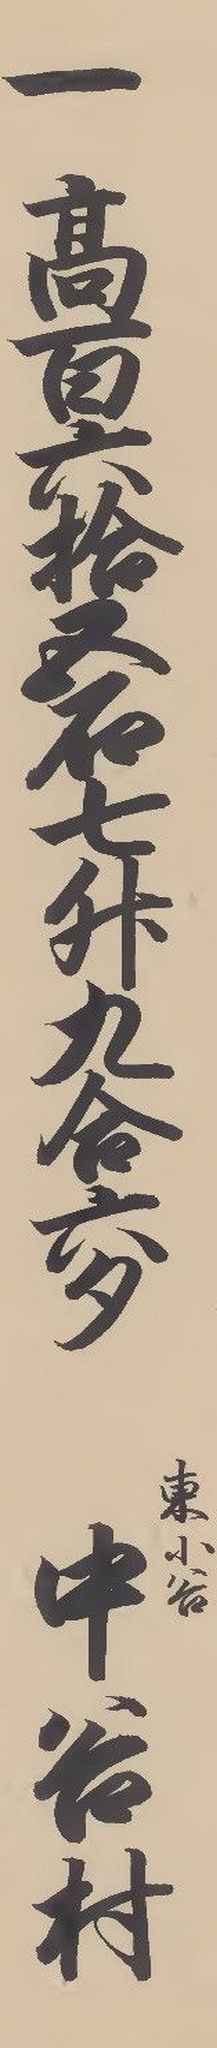一高百六拾五石七升九合六勺中谷村
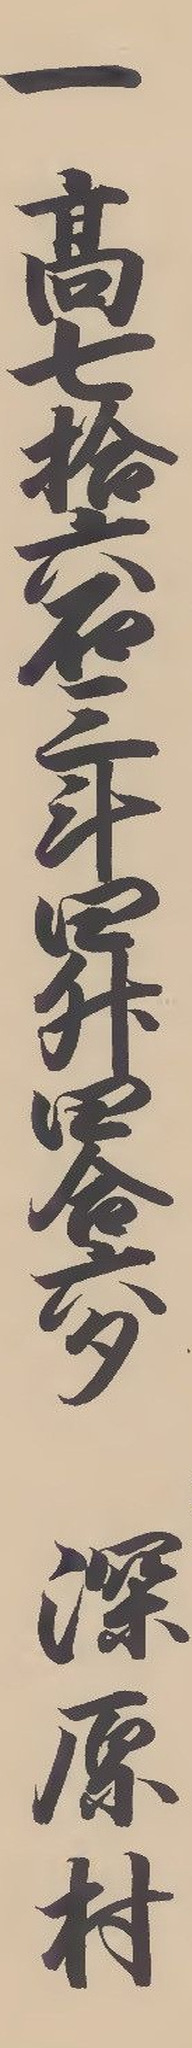一高七拾六石三斗四升四合六勺深原村
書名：信濃国郷帳
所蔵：国立公文書館 National Archives of Japan
